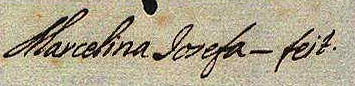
Marcelina Iosefa - feit.
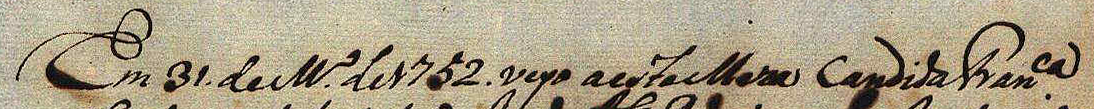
Em 31. de M.o de 1752. veyo a esta Meza Candida Fran.ca
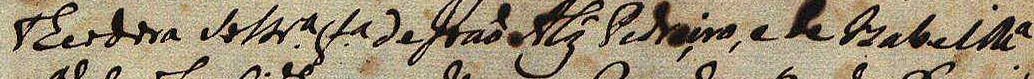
theodora soltr.a f.a de Joaõ Alz̄ Pedreiro, e de Izabel Ma
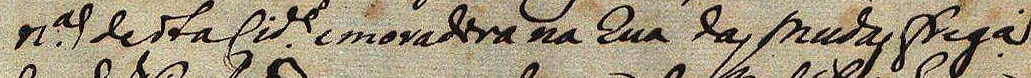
n.al desta Cid.e e moradora na Rua das mudas frega
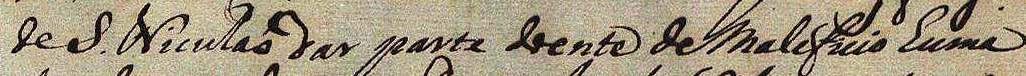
de S. Niculaó dar parte doente de Maleficio huma
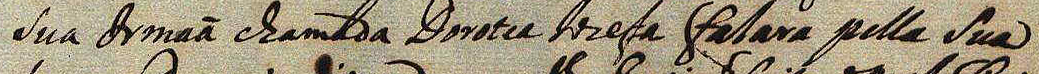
sua Irmaã chamada Dorotea Iozefa falara pella Sua
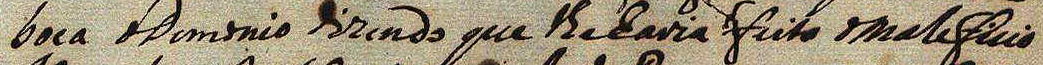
boca o Demonio dizendo que lhe havia feito o maleficio
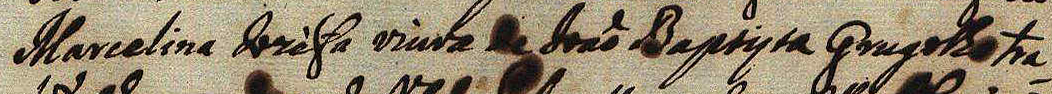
Marcelina Iozéfa viuva de Ioaõ Baptista Grugolho tra
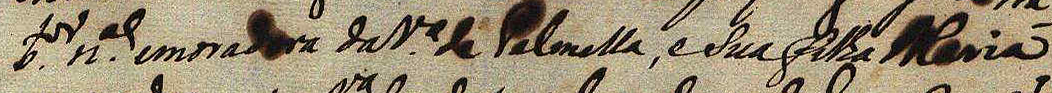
b̄.or n.al e moradora da V.a de Palmella, e Sua filha Maria
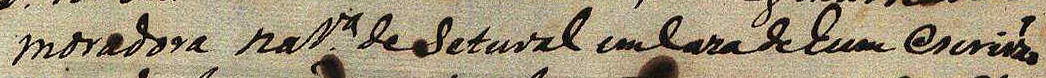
moradora na V.a de Setuval em Caza de hum escrivão
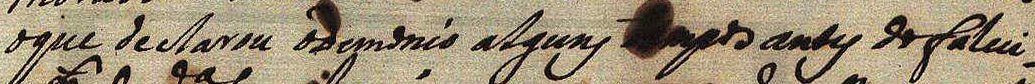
o que declarou o demonio alguns __mpos antes do faleci
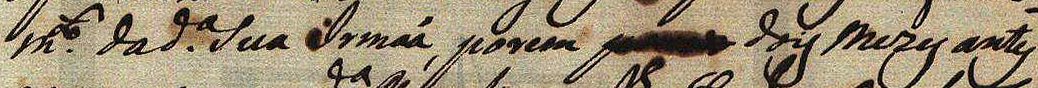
m.to da d.a sua Irmaã, porem p__ dois mezes antes
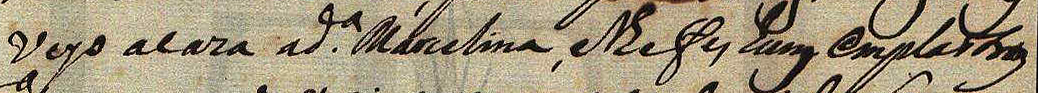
veyo a caza a d.a Marcelina, e lhe fes huns Emplastroz
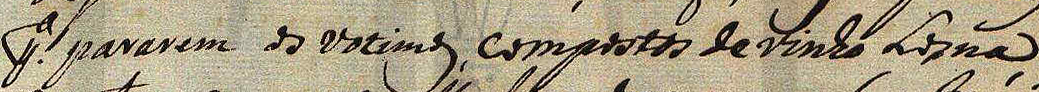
p.a pararem os votimos, compostos de vinho Losna,
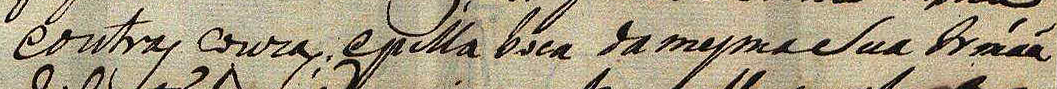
e outras couzas, e pella boca da mesma Sua Irmaã
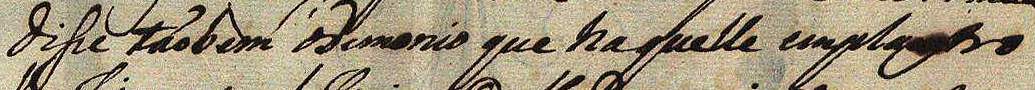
disse tãobem o demonio que naquelle emplastro
